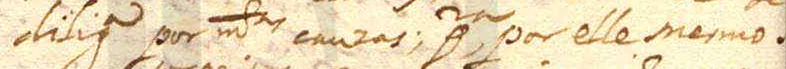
diliga por mtas cauzas; pra por elle Mesmo.
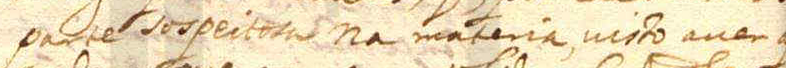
parte sospeitosa na materia uisto auer
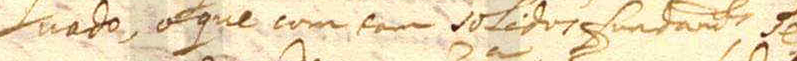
uado, o que com tam solidos fundamtos se
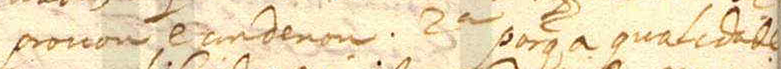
prouou e condenou. 2a porq a qualidade
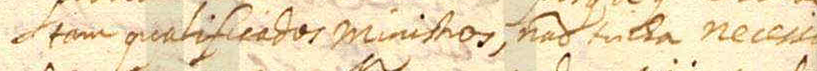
tam qualificados ministros, naõ tinha necessi
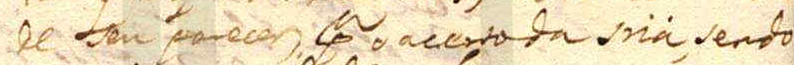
de seu parecer, pa o acerto da snā, sendo
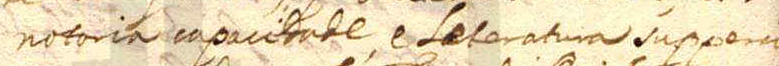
notoria capacidade e Leteratura supperio
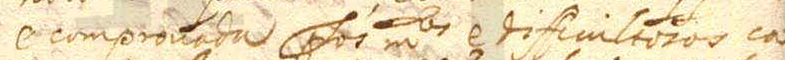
e comprouada plos mtos o difficultozos ca
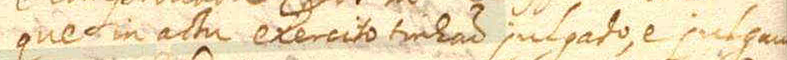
que in actu exercito tinhaõ julgado, e julgau
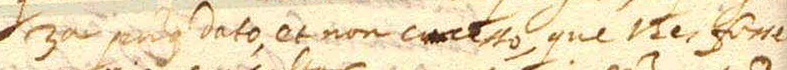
3a porq̄ dato, et non concesso, que lhes fosse
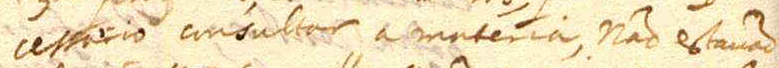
cessario consultar a materia, naõ estauaõ
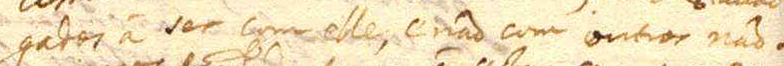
gados a ser com elle, e naõ com outros não
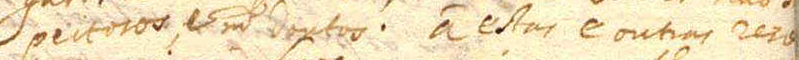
peitosos, e mto doutos. a estas e outras rezo
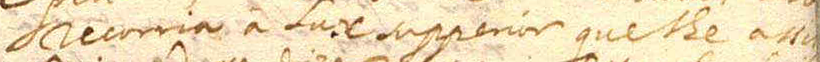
Recorria à Iux supperior que lhe assi
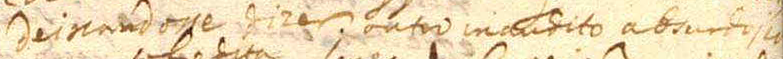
deixandosse dizer outro in audito absurdissi
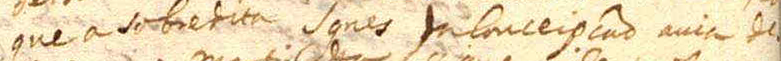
que a sobredita Ignes da Conceipçaõ auia de
